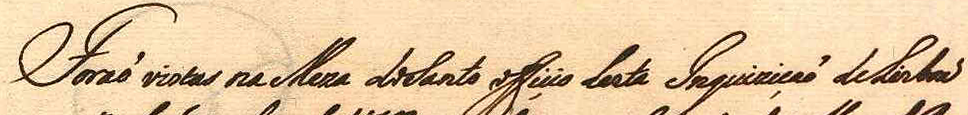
Foraõ vistas na Meza do Santo officio desta Inquisiçaõ de Lisboa
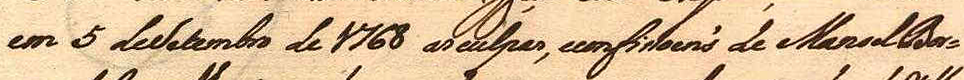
em 5 de Setembro de 1768 as culpas, e confissoens de Manoel Bor
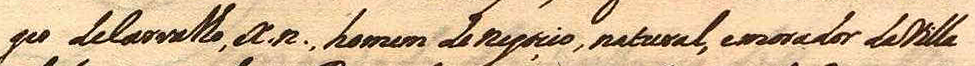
ges de Carvalho, x. n. homem de negocio, natural, e morador da Villa
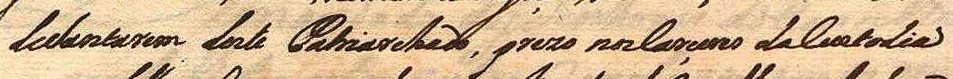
de santarem deste Patriarchado, prezo nos Carceres da Custodia
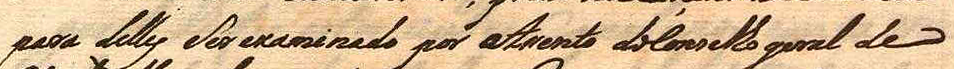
para delles Ser examinado por Assento do Conselho geral de
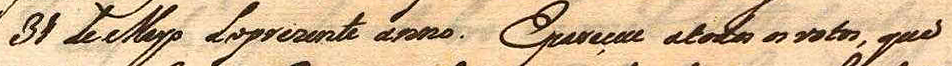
31 de Mayo do prezente anno. E pareceu a todos os votos, que
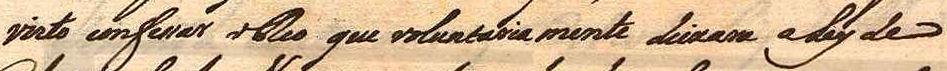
visto confessar o Reo que voluntariamente deixara a Ley de
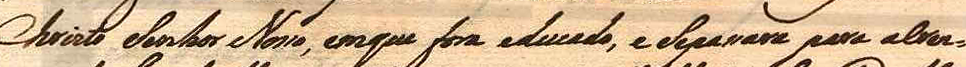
Christo Senhor Nosso, em que fora educado, e se passara para a Cren
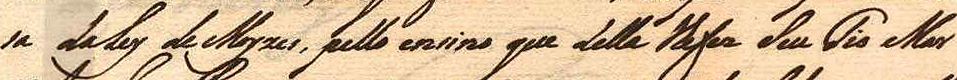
sa da Ley de Moyzes, pello ensino que della lhe fez Seu Tio Mar
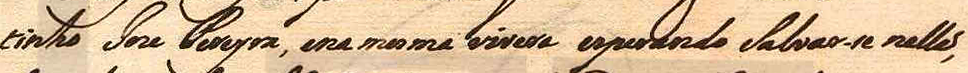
tinho Ioze Pereyra, e na mesma vivera esperando Salvar-se nella,
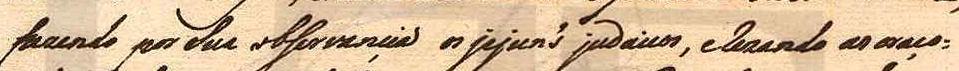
fazendo por Sua observancia os jejuns judaicos, e Rezando as oraço
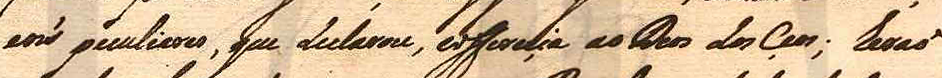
ens peculiares, que declarou, e offerecia ao Deos dos Ceos; heraõ
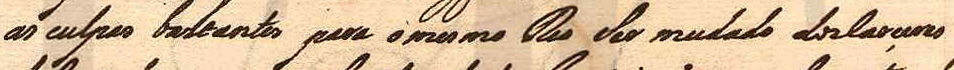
as culpas bastantes para o mesmo Reo Ser mudado dos Carceres
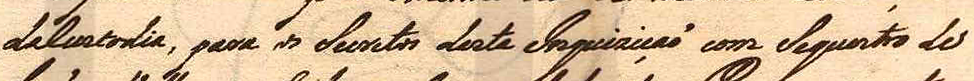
da Custodia, para os Secretos desta Inquiziçaõ com Sequestro de
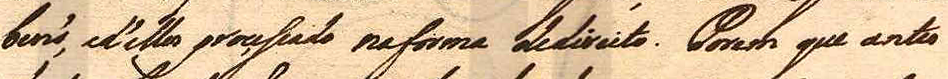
bens, e d'elles processado na forma de direito. Porem que antes
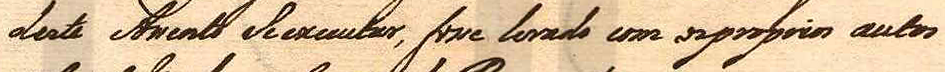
deste Assento Se executar fosse levado com os proprios autos
